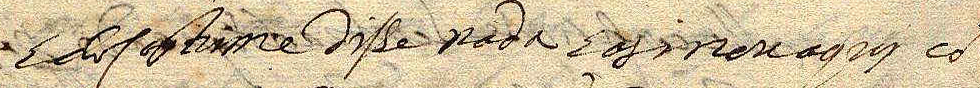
E do Costume disse nada E asinou aquj cō
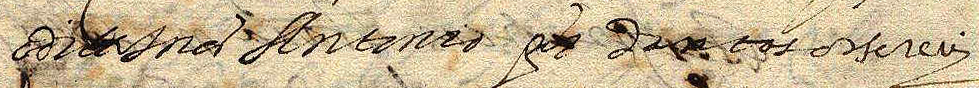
o dito snor̄ Antonio piz̄ dantas o escreuj
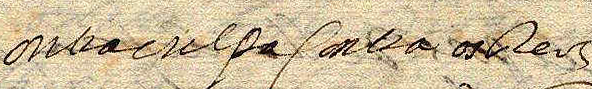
outra culpa Contra os Reos
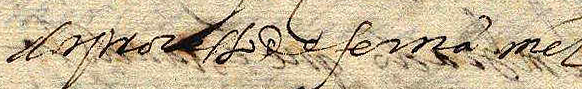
do processo de fernā mēz
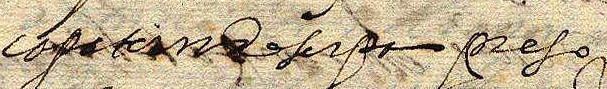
capateiro de serpa preso
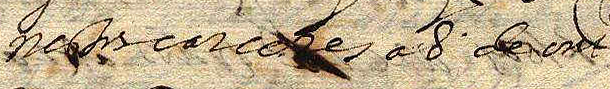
nestes carceres a 8 de outro
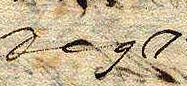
de 97
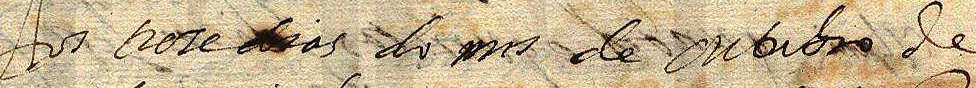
Aos treze dias do mes de outubro de
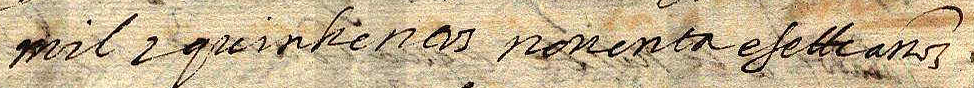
mil E quinhentos nouenta e sette anōs
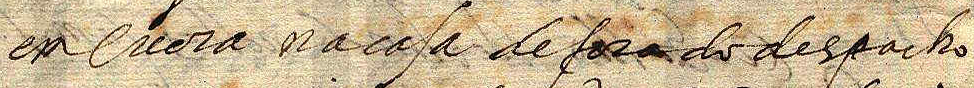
em euora na casa de fora do despacho
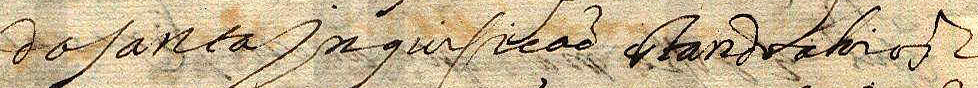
da santa Jnquisiçaõ estando ahi o sor
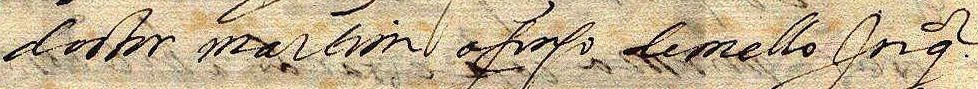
doctor martim afonso de mello Jnqor
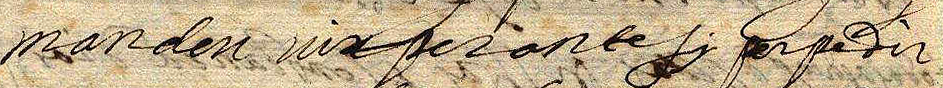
mandou uir perante sy por pedir
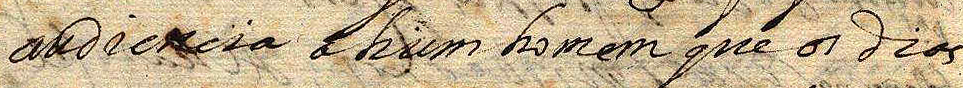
audiencia a hum homem que os dias
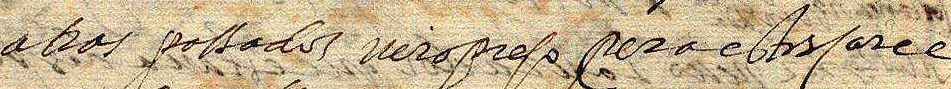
atras passados ueio preso pera estes Carce
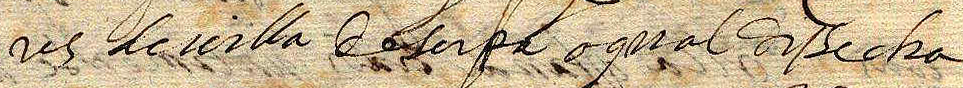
res de uilla de serpa o qual disse cha
